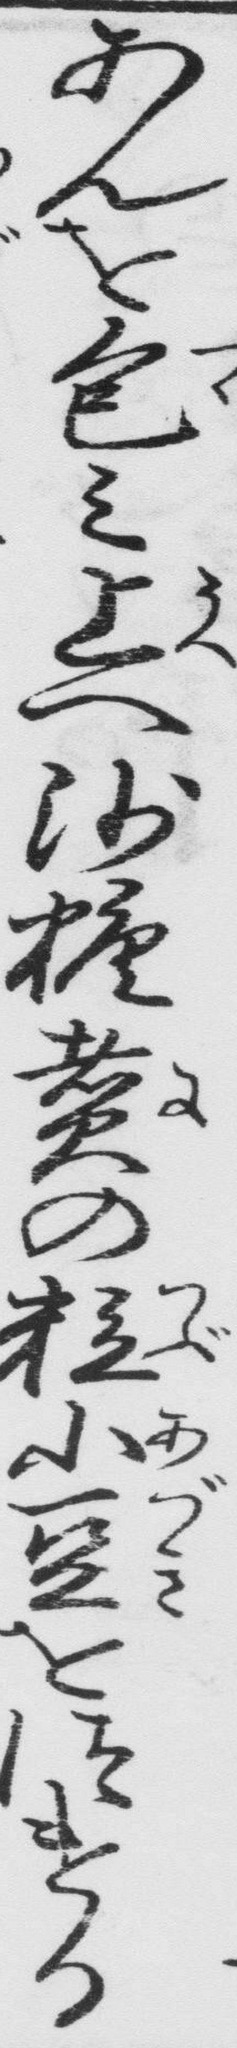あんを包み上へ沙糖煮の粒小豆をつける
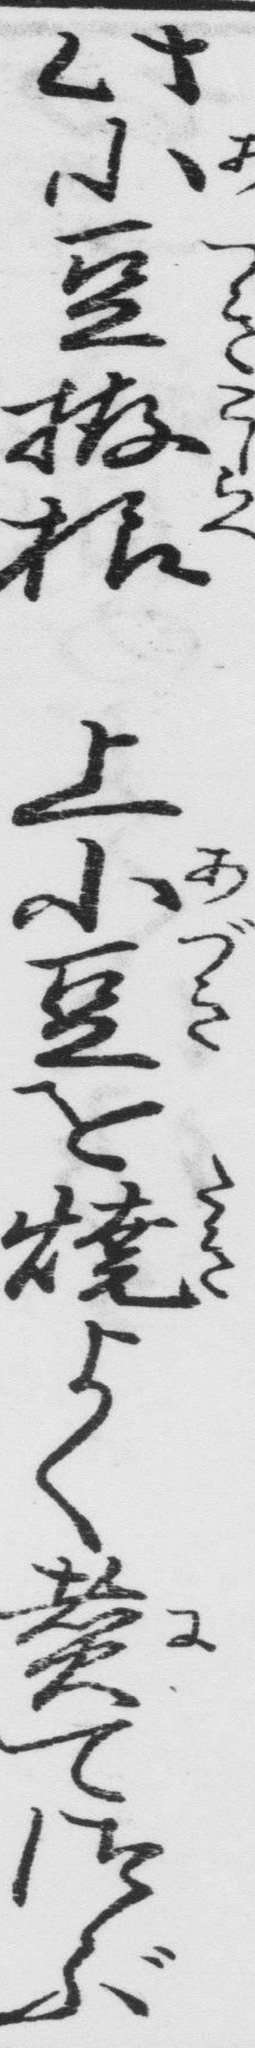此小豆拵様上小豆を焼よく煮てつぶ
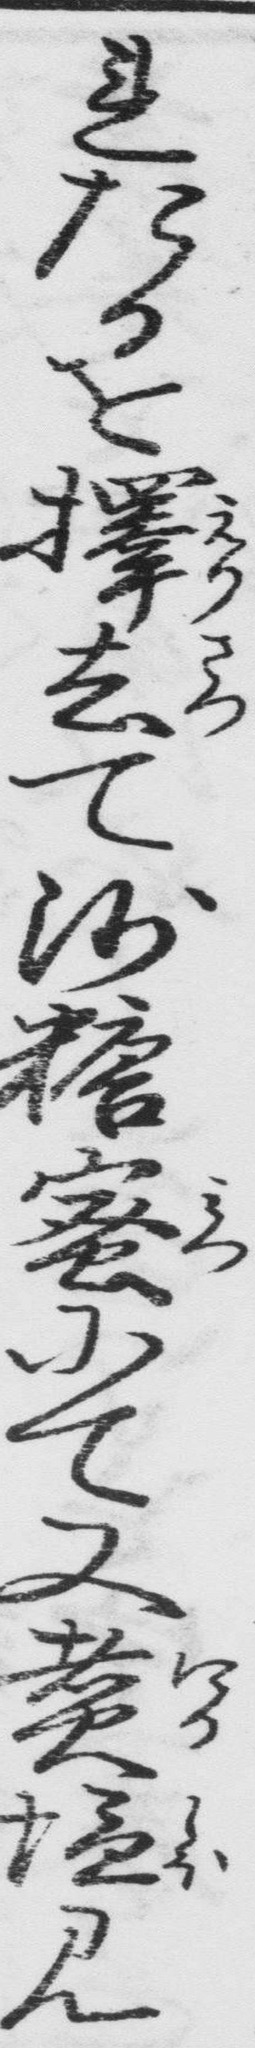れたるを択去て沙糖蜜にて又煮塩見
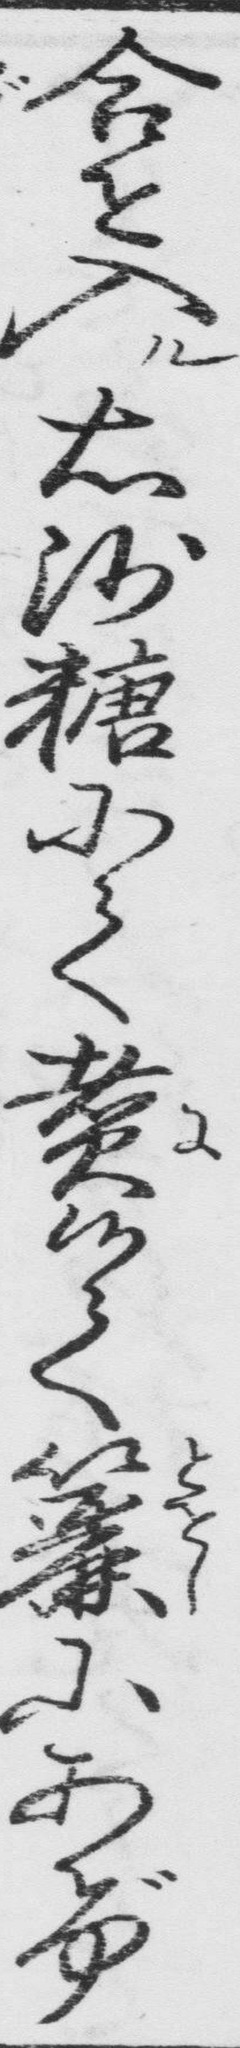合せ入る右沙糖にて煮候て簾にあげ
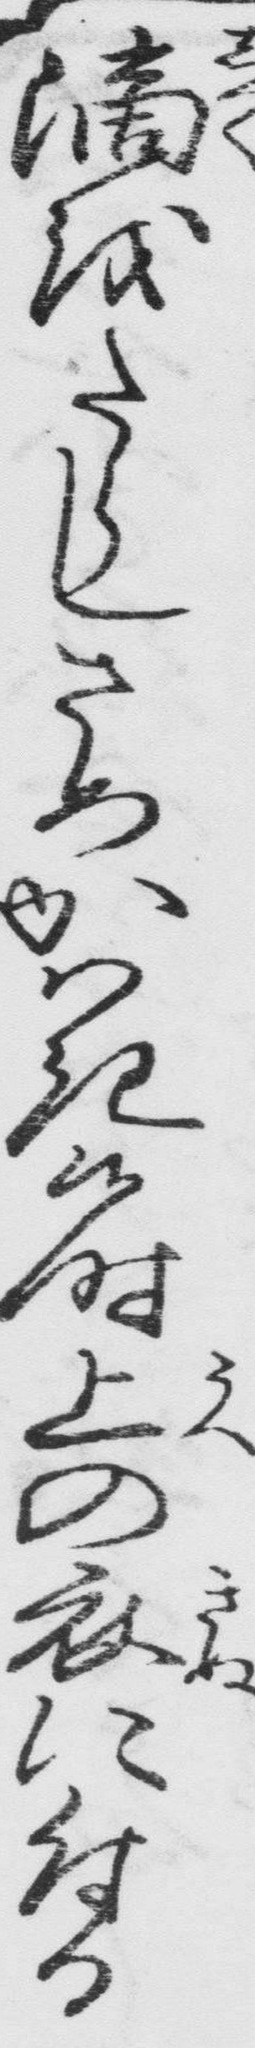滴をたらしさめかはき候時上の衣に付る
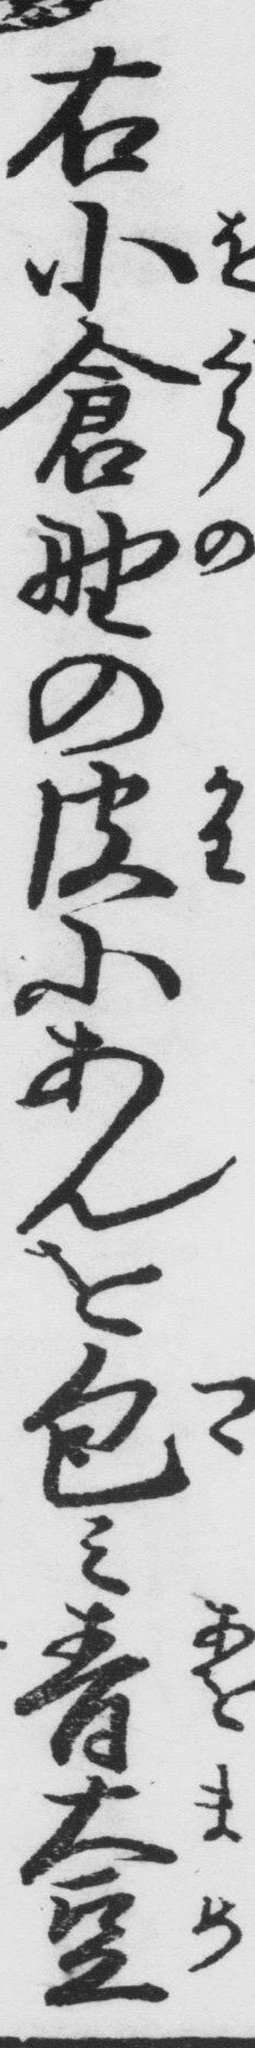右小倉野の皮にあんを包み青大豆
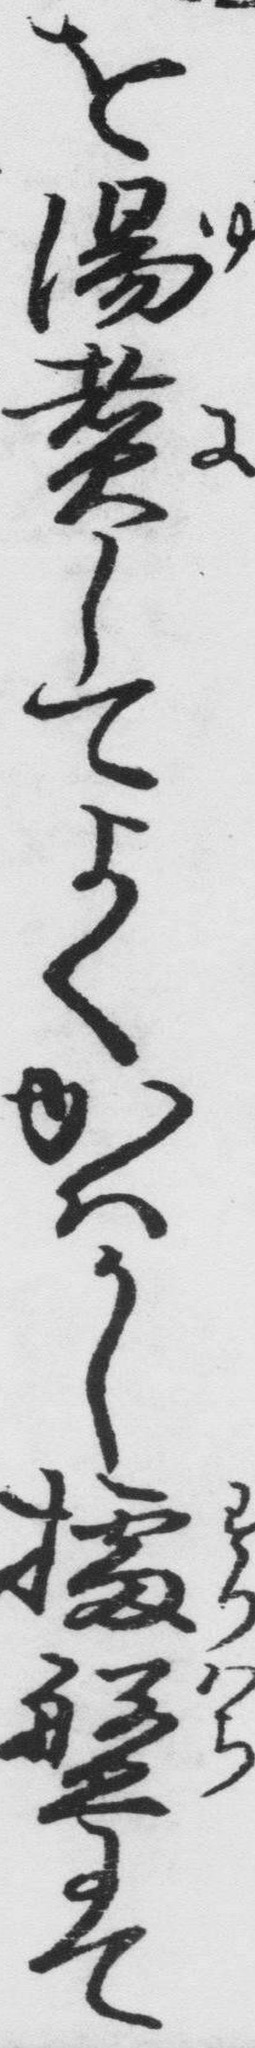を湯煮してよくかはかし擂盤にて
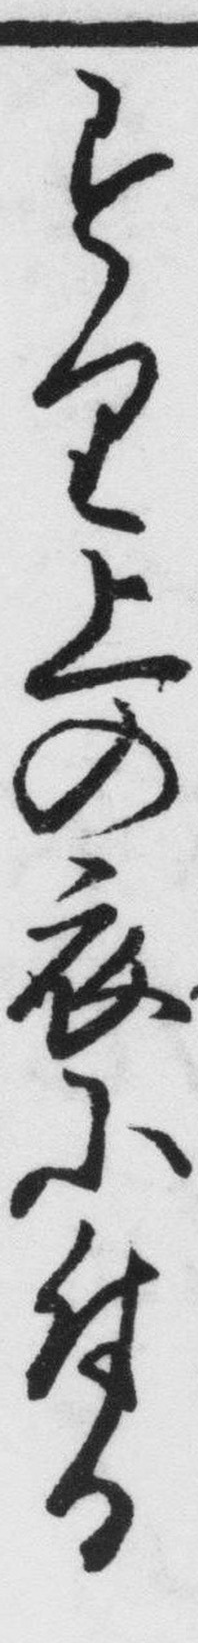すり上の衣に付る
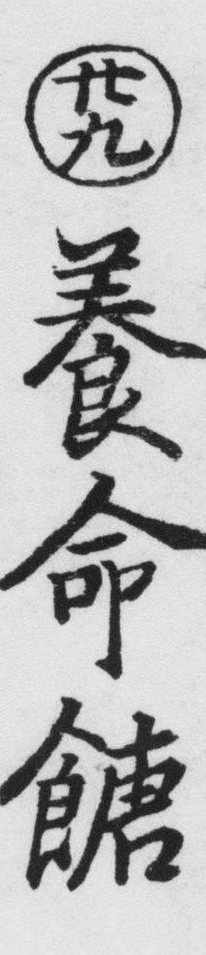(廿九)養命餹

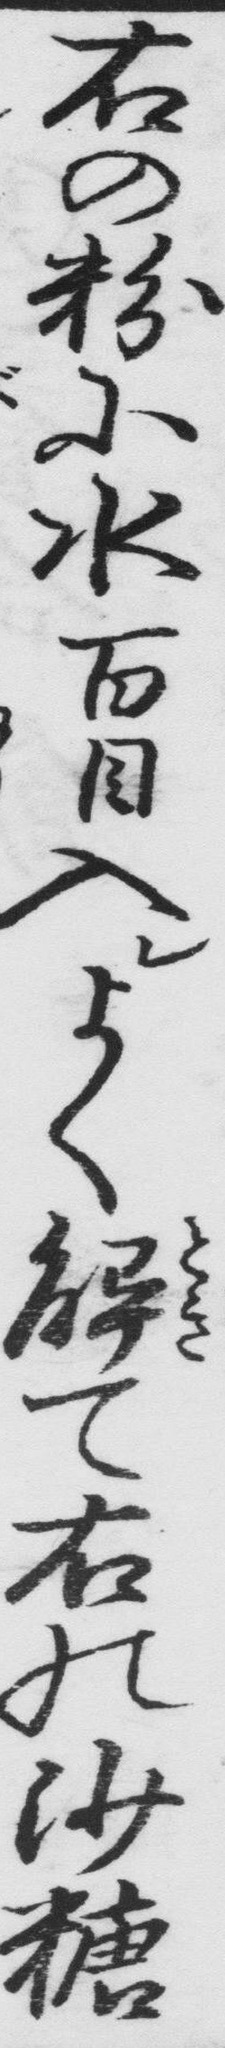右の粉に水百目入れよく解て右の沙糖
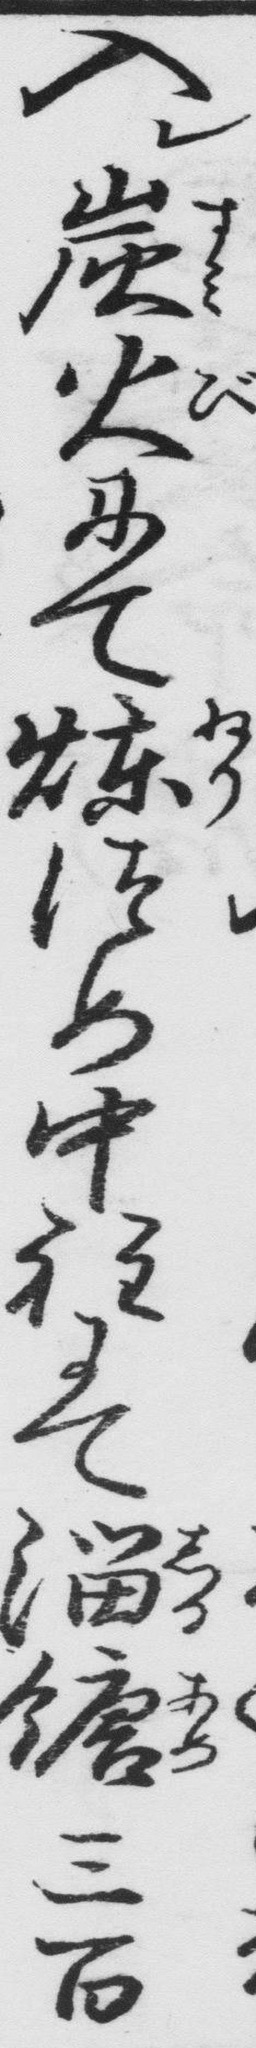入れ炭火にて煉つめ中程にて溜餹三百
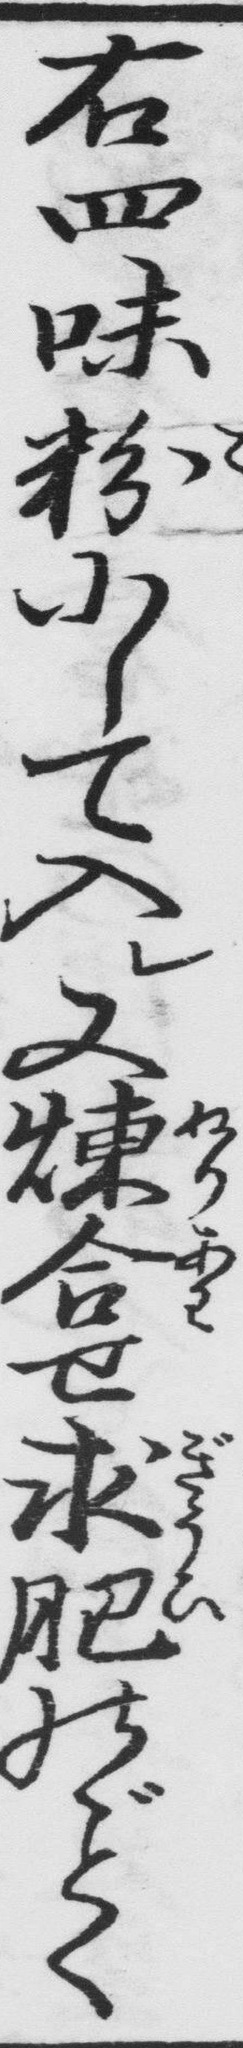右四味粉にして入れ又煉合せ求肥のごとく
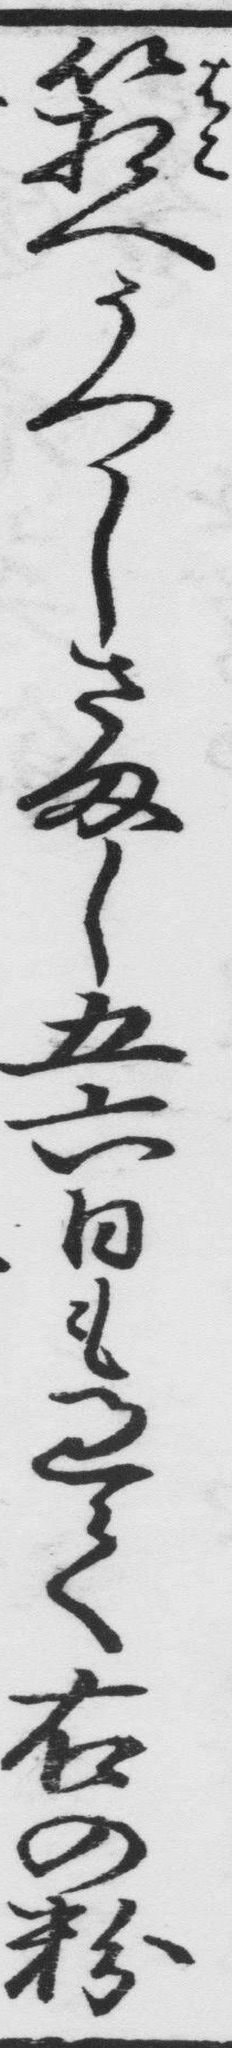箱へうつしさまし五六日も過て右の粉
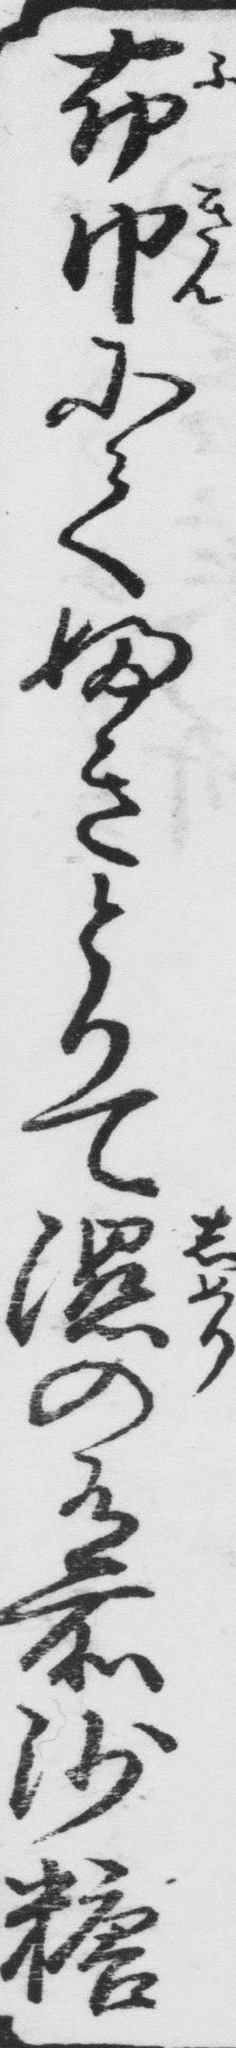布巾にてふきとりて湿の有所沙糖
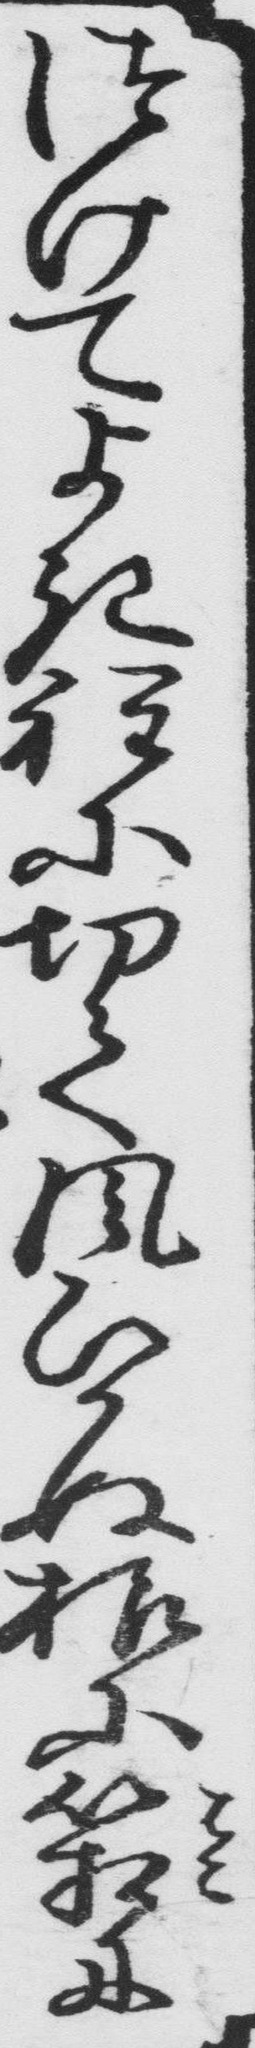つけてよき程に切て風ひかぬ様に箱に
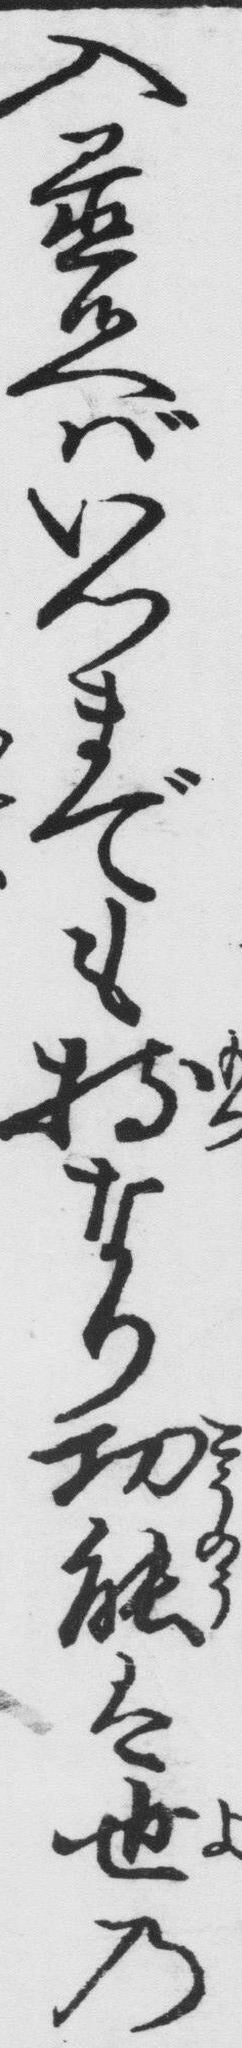入置候へばいつまでも持なり効能は世の
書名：御前菓子図式
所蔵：大阪府立大学学術情報センター 国文学研究資料館
